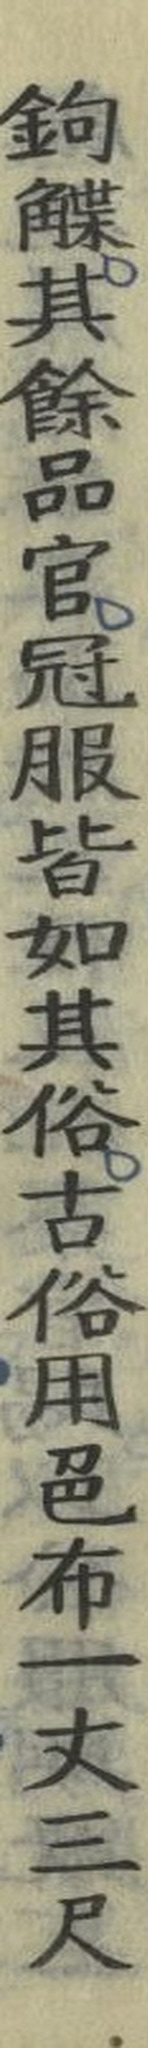鉤䚢。其餘品官。冠服皆如其俗。古俗用色布一丈三尺
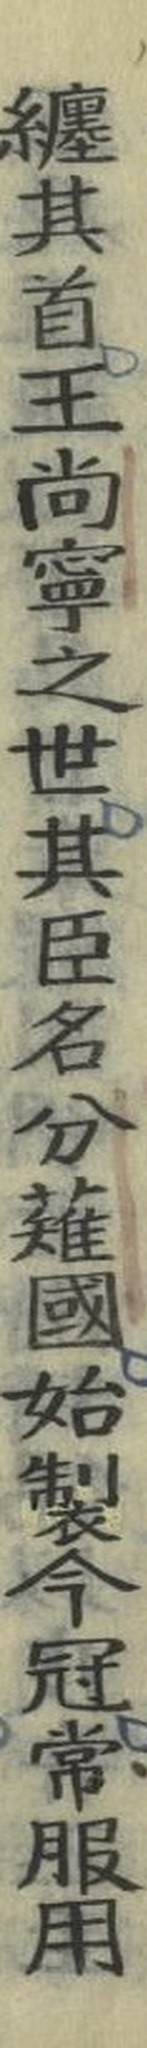纏其首。王尚寧之世。其臣名分薙國。始製今冠。常服用
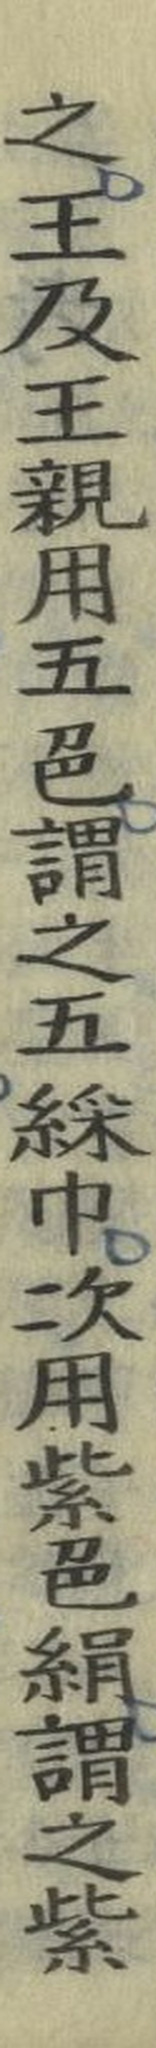之。王及王親用五色。謂之五綵巾。次用紫色絹。謂之紫
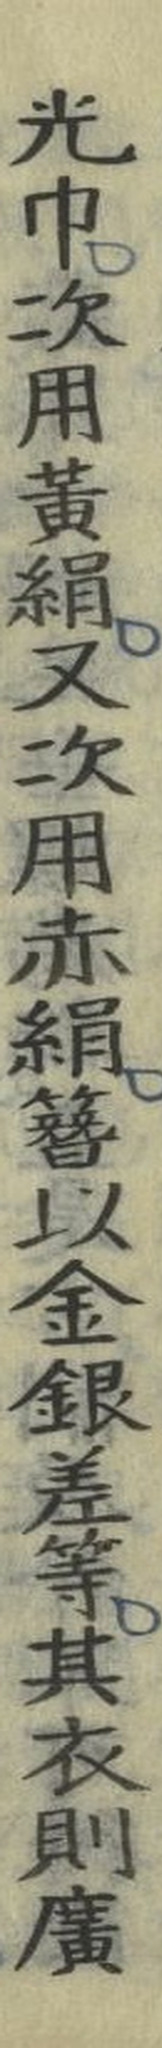光巾。次用黃絹。又次用赤絹。簪以金銀差等。其衣則廣
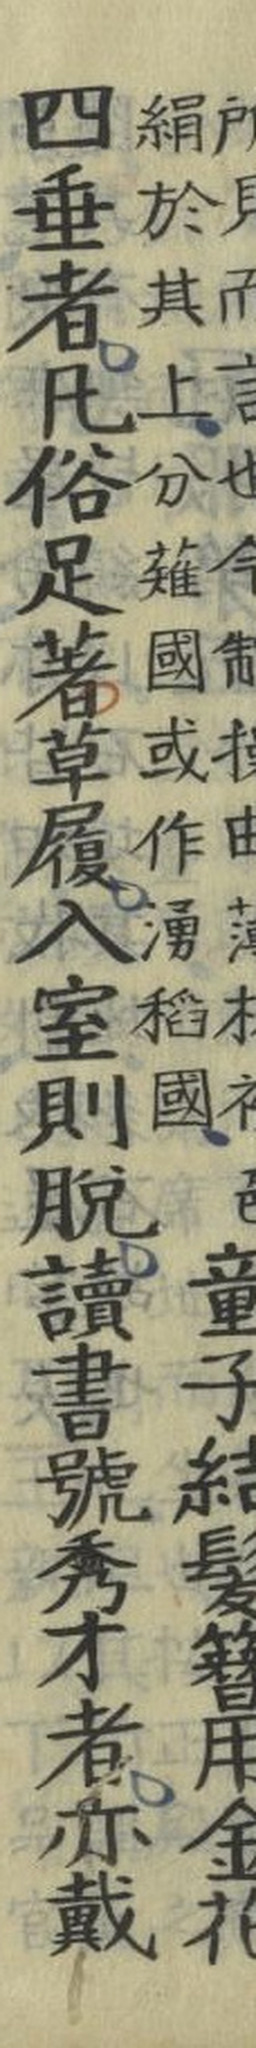四垂者。凡俗足著草履。入室則脫。讀書號秀才者。亦戴
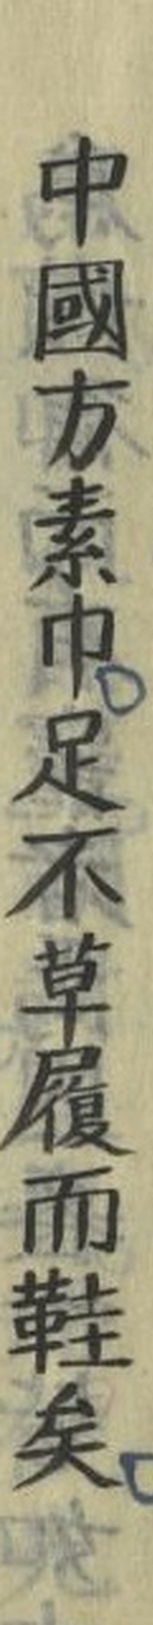中國方素巾。足不草履而鞋矣。
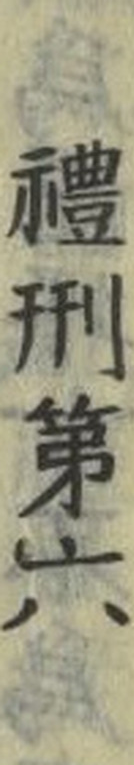禮刑第六
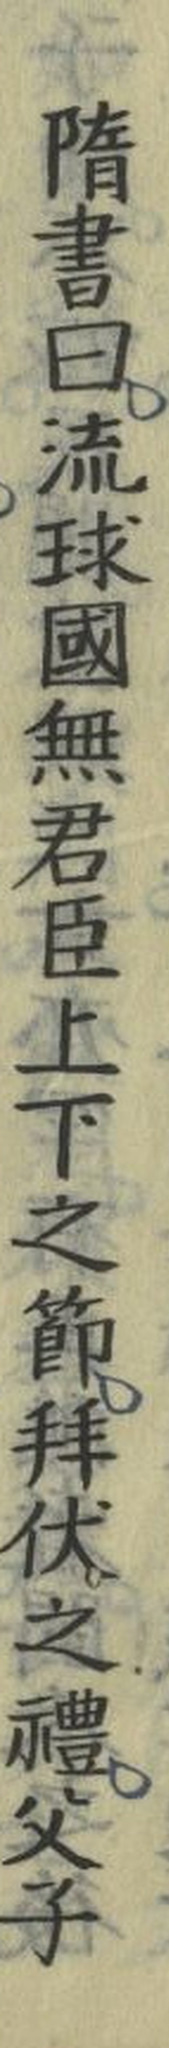隋書曰。流球國無君臣上下之節。拜伏之禮。父子
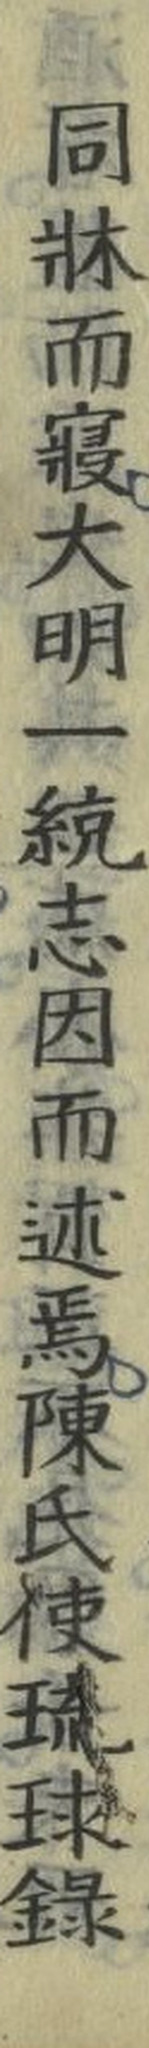同牀而寢。大明一綂志因而述焉。陳氏使琉球錄
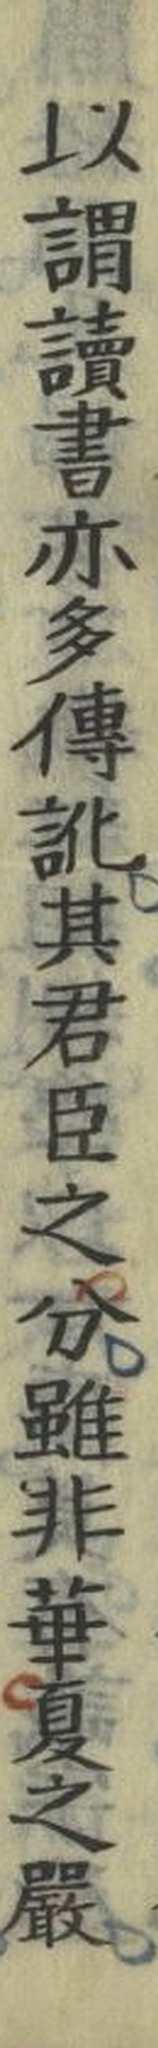以謂讀書亦多傳訛。其君臣之分。雖非華夏之嚴。
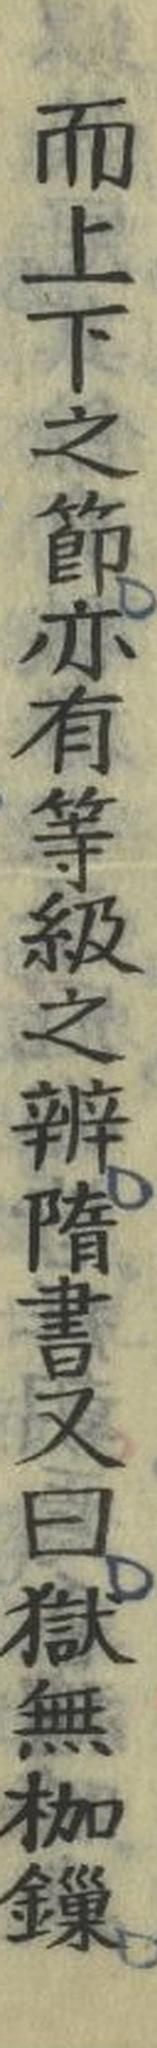而上下之節。亦有等級之辨。隋書又曰。獄無枷鏁。
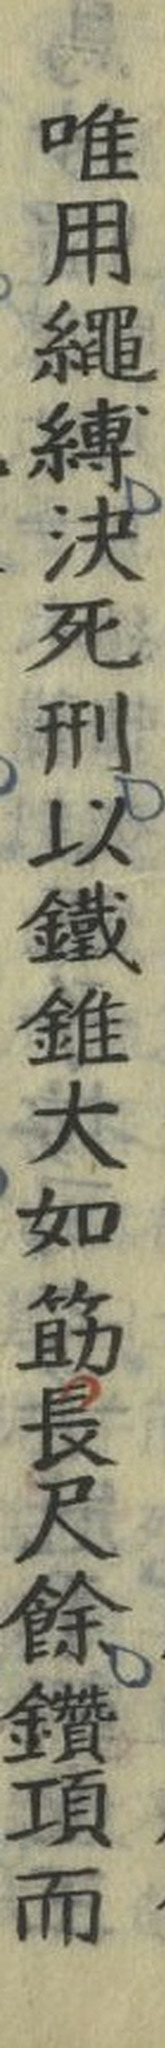唯用繩縛。決死刑。以鐵錐大如筯長尺餘。鑽項而
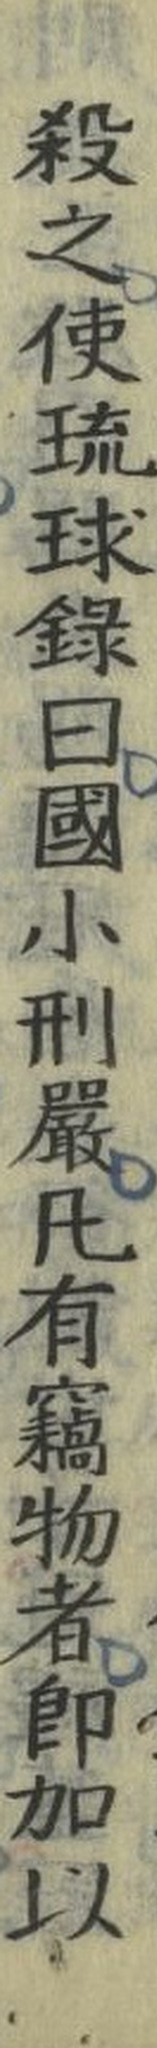殺之。使琉球錄曰。國小刑嚴。凡有竊物者。卽加以
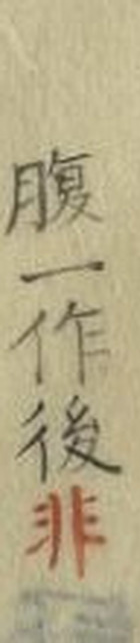腹一作後非
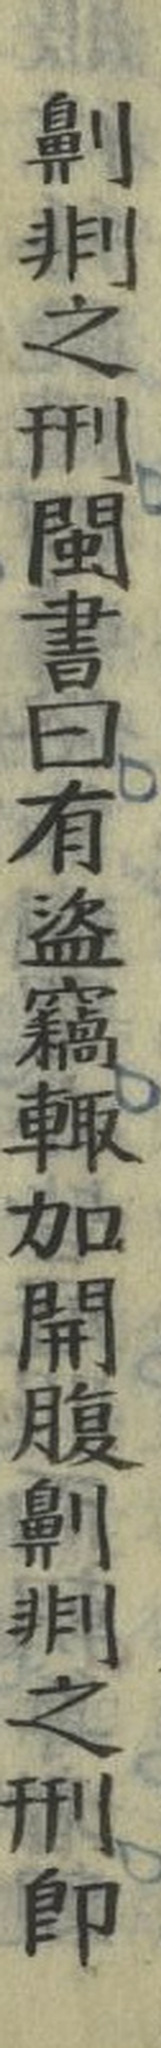劓剕之刑。閩書曰。有盜竊。輙加開腹劓剕之刑。卽
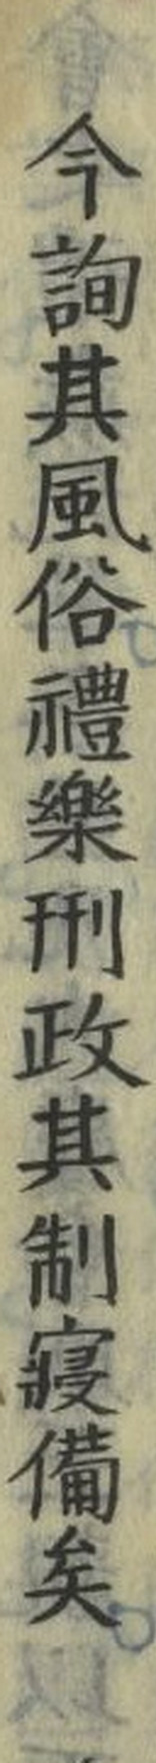今詢其風俗。禮樂刑政其制寢僃矣。
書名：南島志
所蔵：University of the Ryukyus Library
